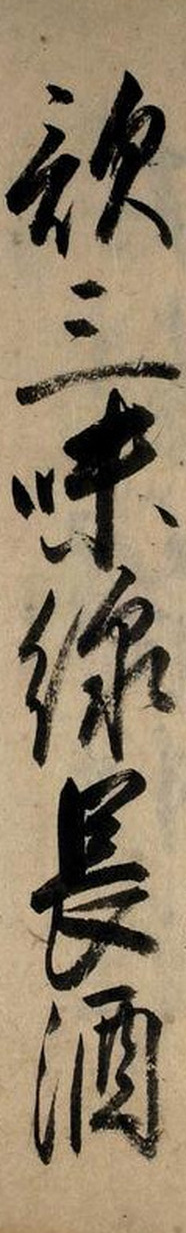歌三味線長酒
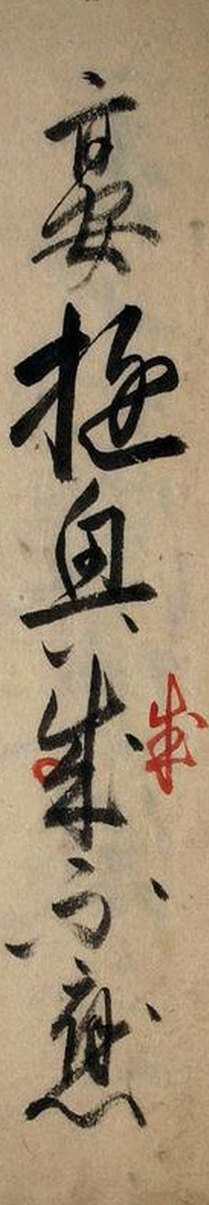宴遊興不応
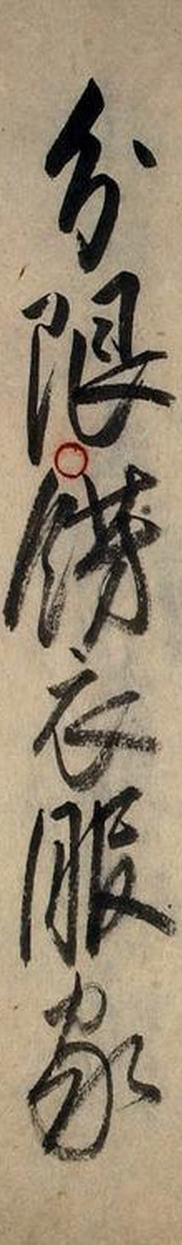分限餝衣服家
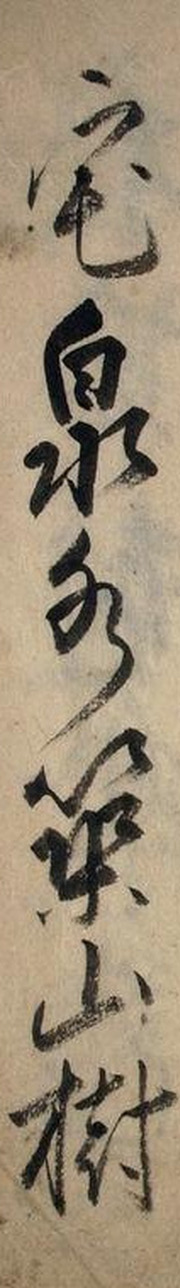宅泉水築山樹

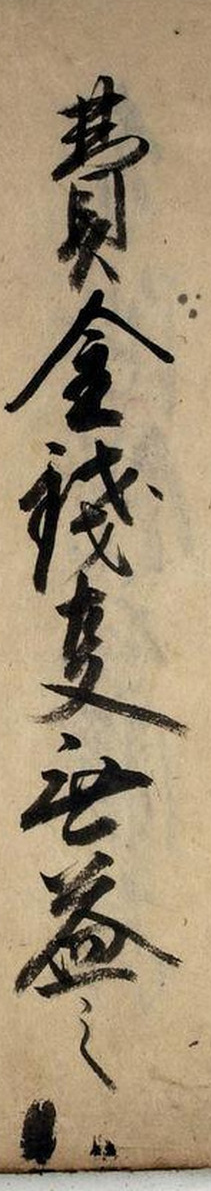費金銭事無益之
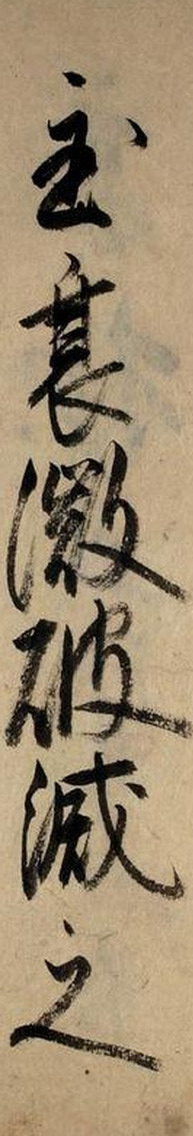至衰微破滅之
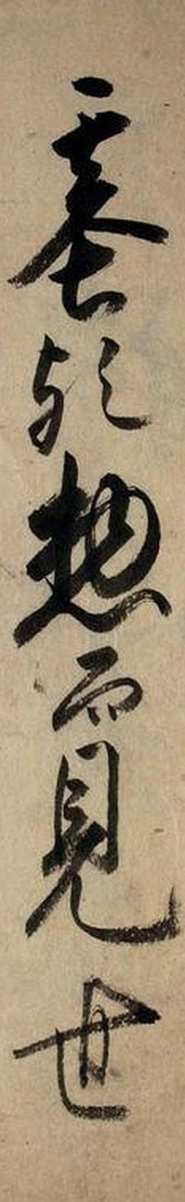基歟惣而見世
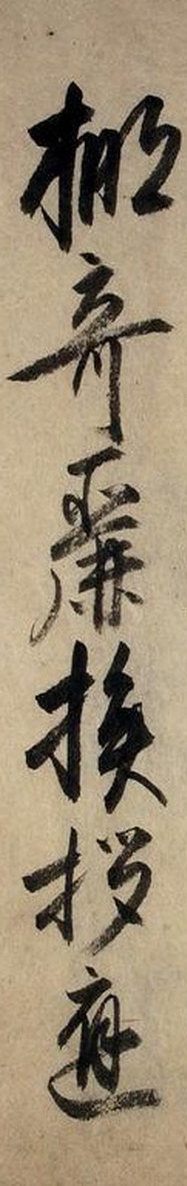棚奇麗挨拶応
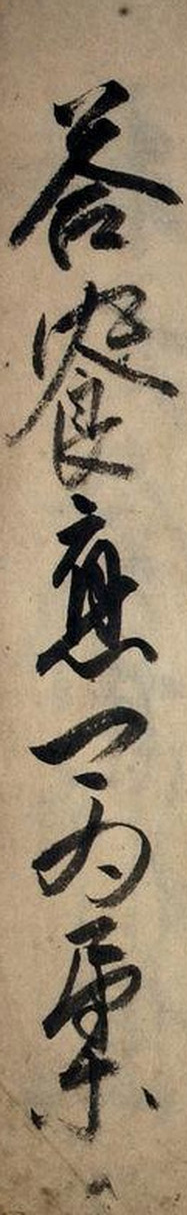答饗応可爲柔

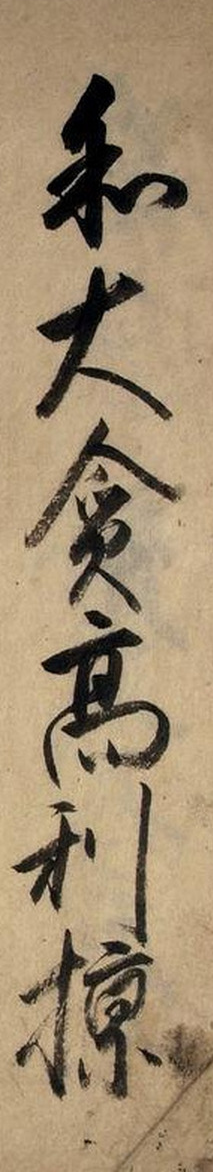和大貪高利掠
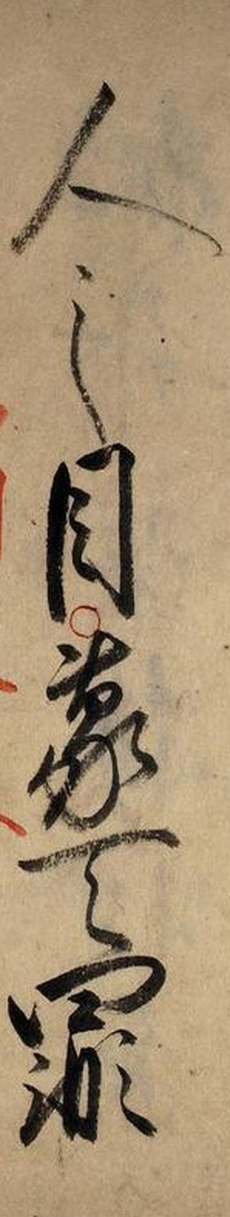人之目蒙天罪
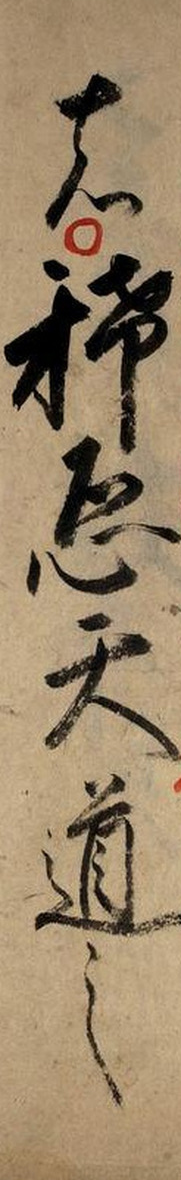者稀恐天道之
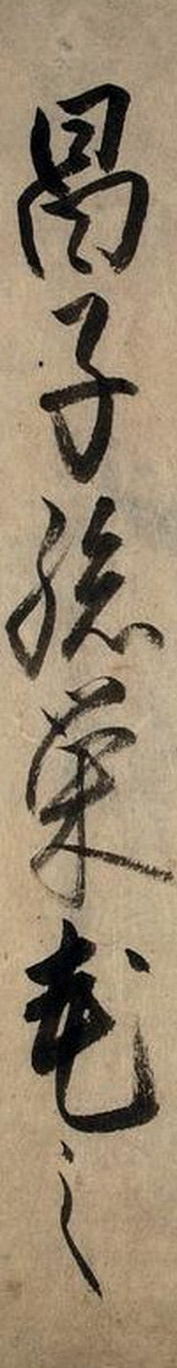昌子孫栄花之
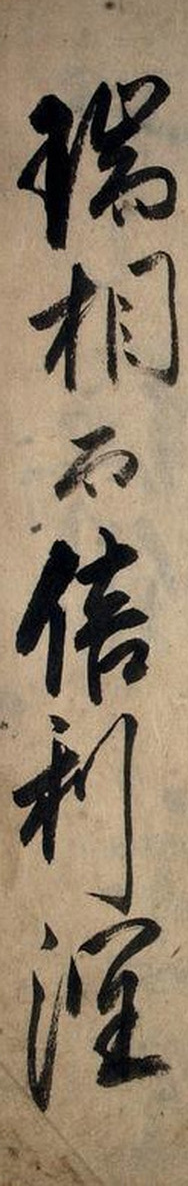瑞相而倍利潤

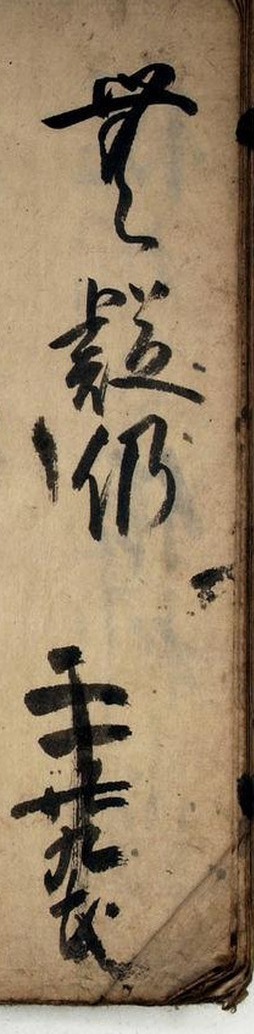無疑仍二十廿九本
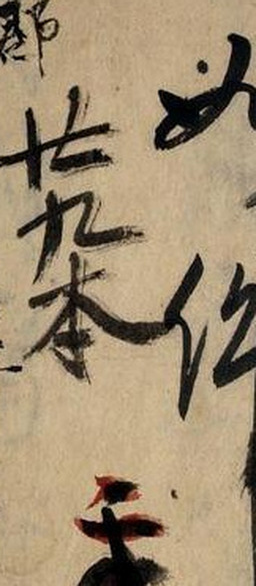廿九本
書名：商売往来（往来物、手習手本）
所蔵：福井県文書館 Fukui Prefectural Archives
